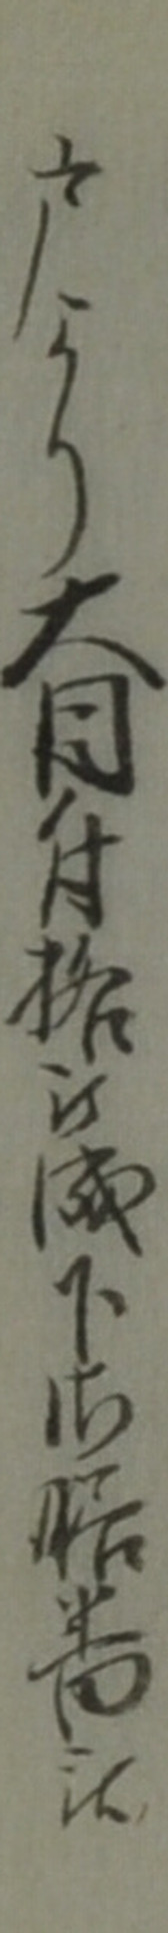戸より大目付格被成下御膳番被
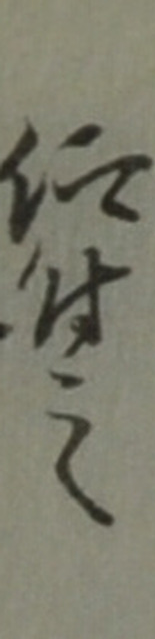仰付之
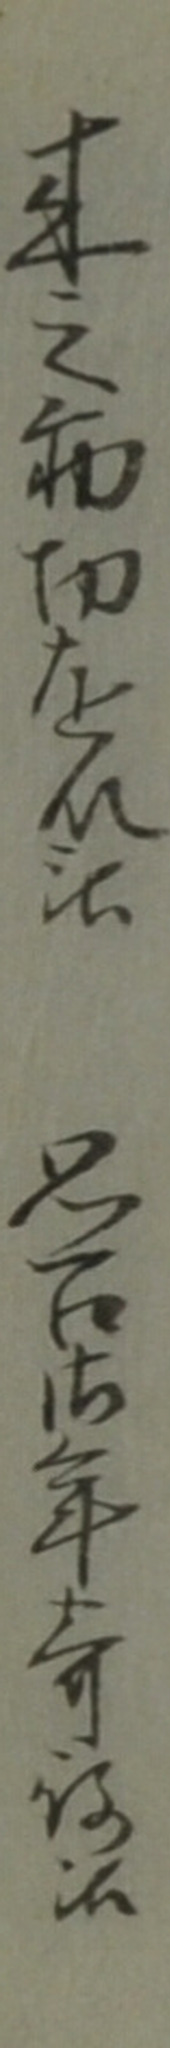来之勤切を以被思召御年寄役被
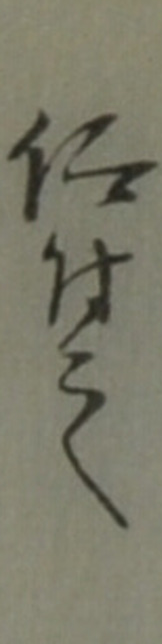仰付之
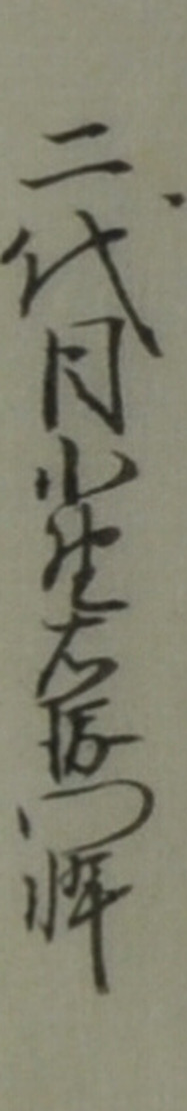二代目小野右衛門忰

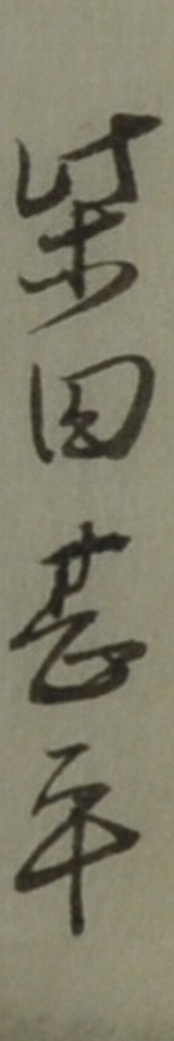柴田甚平
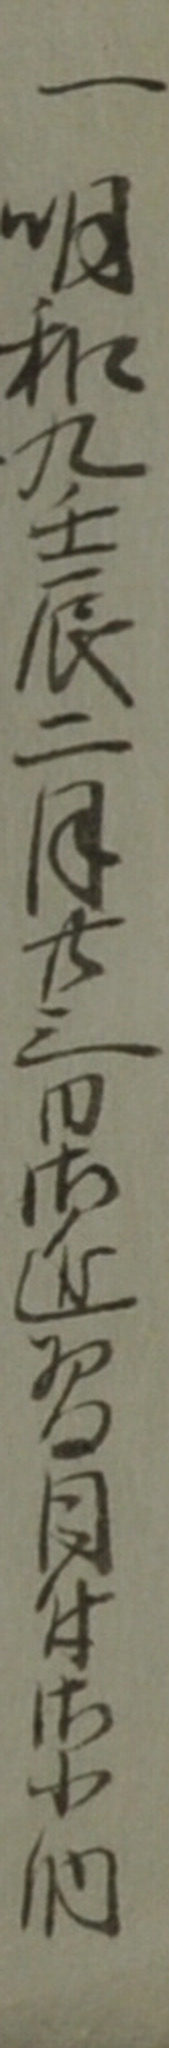一明和九壬辰二月廿三日御近習目付御小納
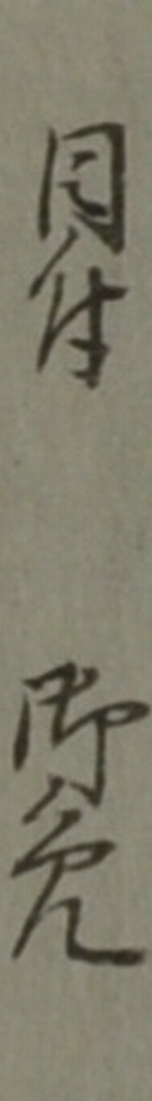目付御免
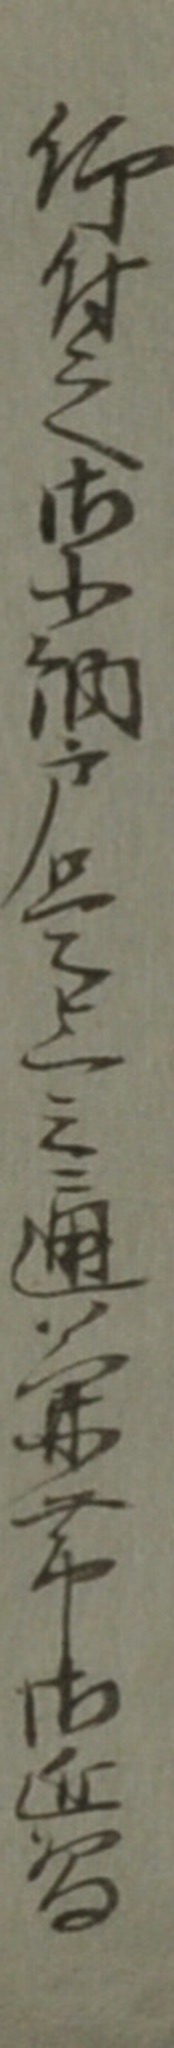仰付之御小納戸是迄之通兼帯御近習
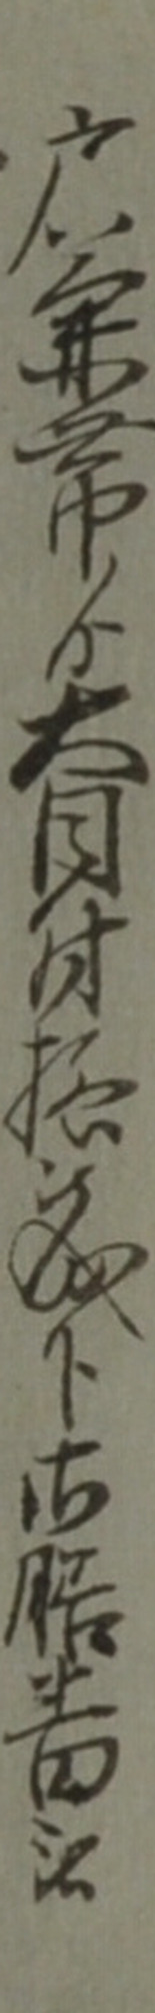戸兼帯ゟ大目付格被成下御膳番被
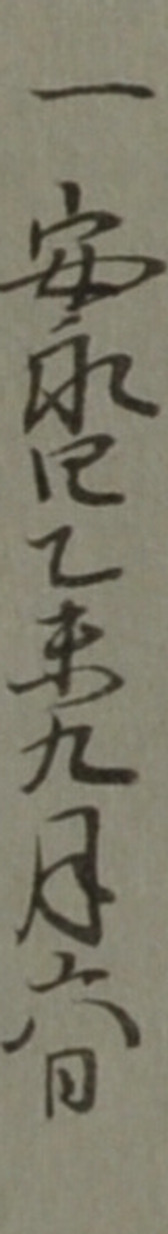一安永四乙未九月六日
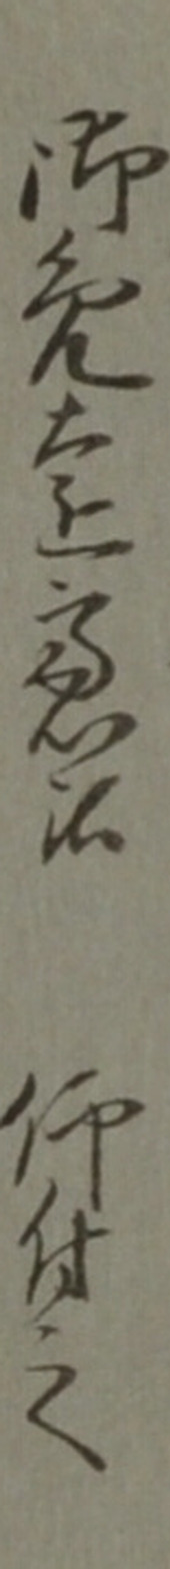御免遠慮被仰付之
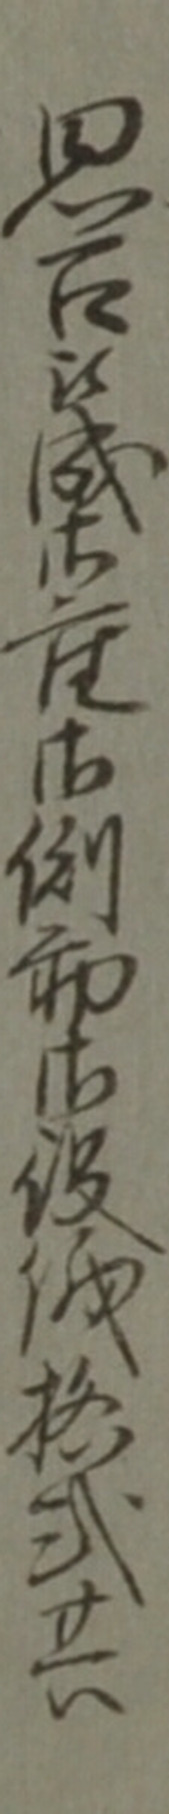思召被成御座御側勤御役儀格式共
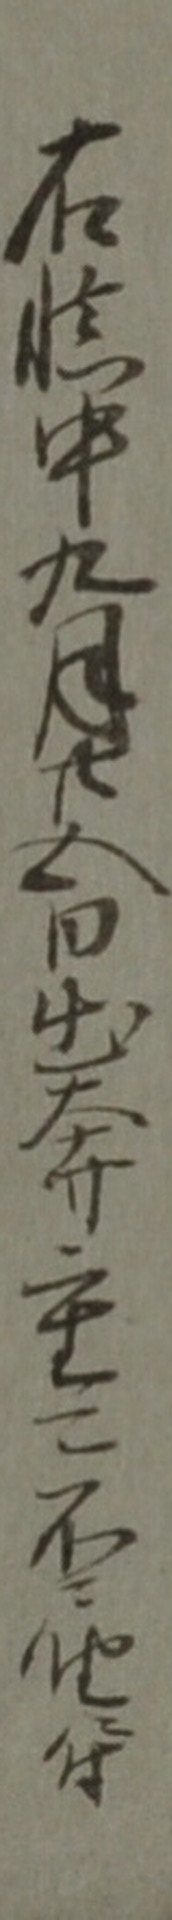右慎中九月廿五日出奔重々不届ニ付
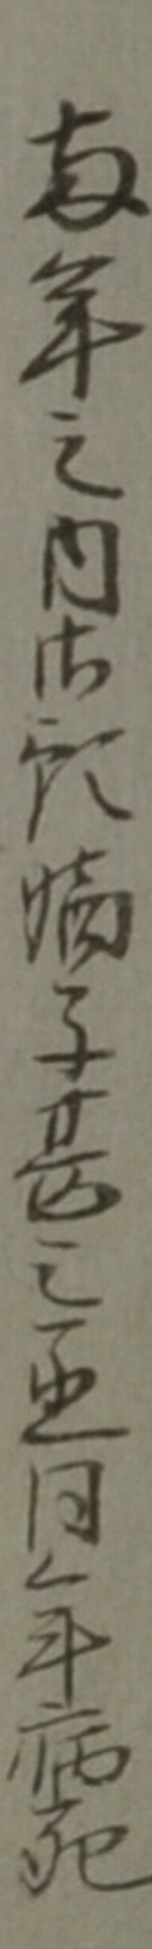両年之内御預嫡子甚之丞同年病死
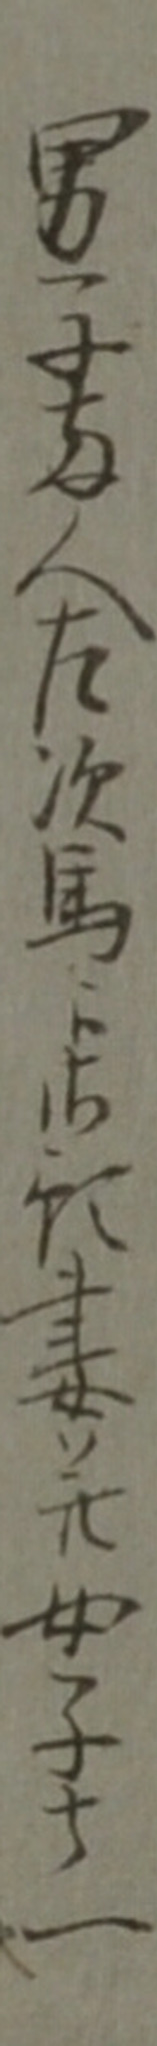男子両人左次馬江御預妻并女子者一
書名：諸御役代々録（四）
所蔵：伊那市立高遠町図書館・合同会社AMANE
